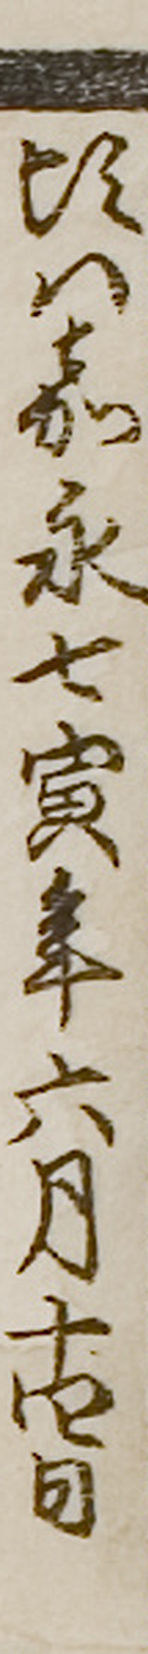頃は嘉永七寅年六月十四日
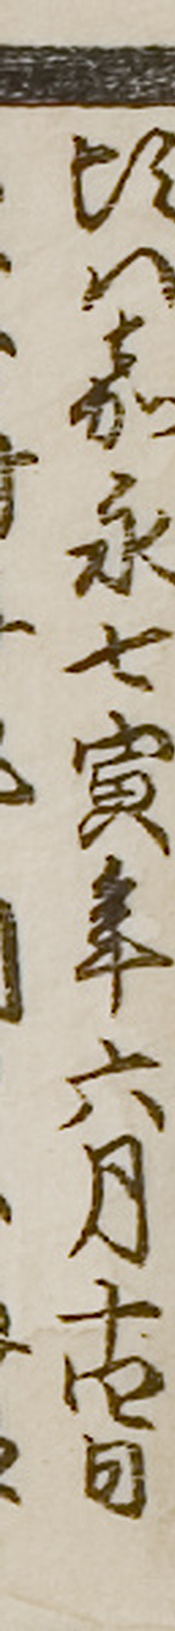頃は嘉永七寅年六月十四日
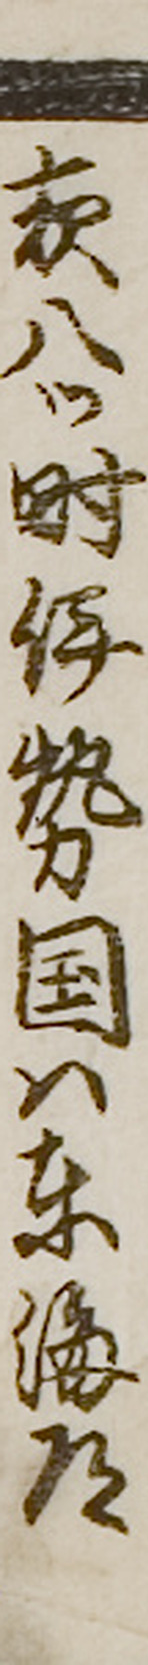夜八つ時伊勢国は東海道
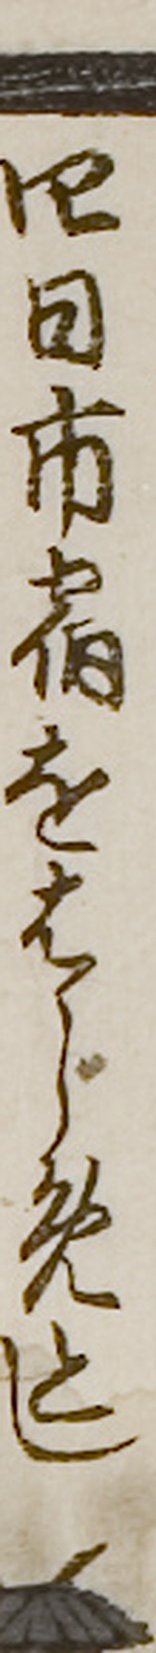四日市宿をはじめとし
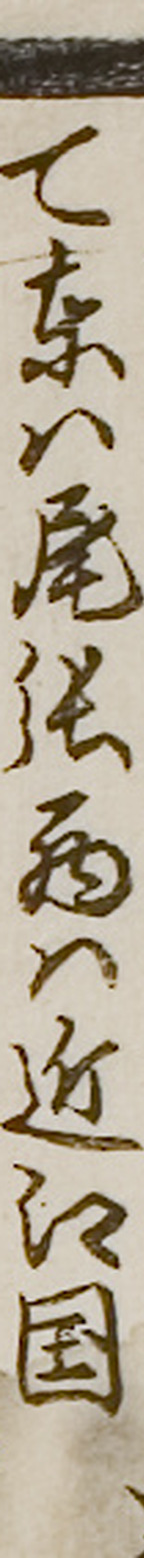て東は尾張西は近江国
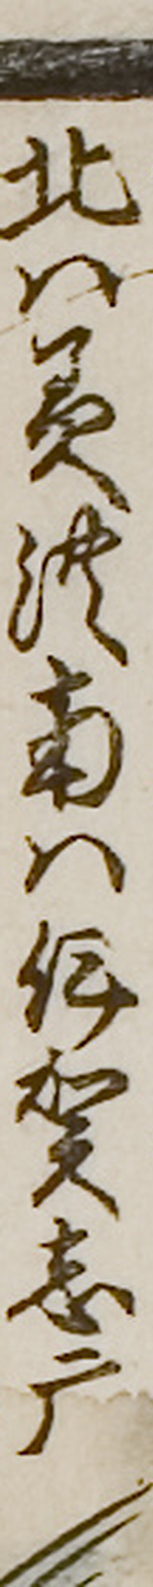北は美濃南は伊賀志摩
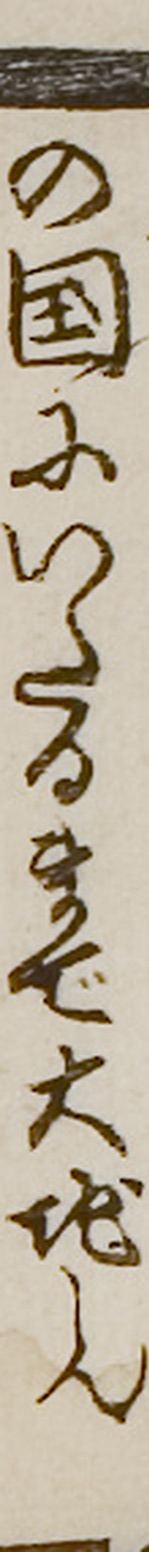の国にいたるまで大地しん
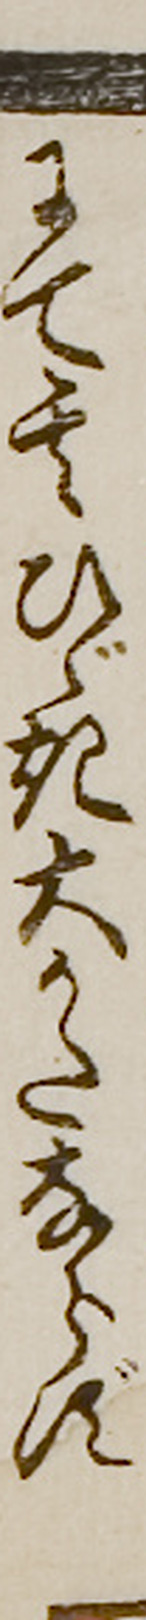にて其ひゞき大かたならず
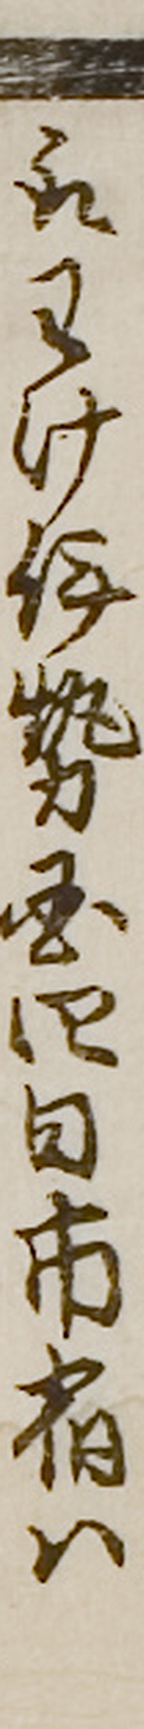取わけ伊勢国四日市宿は
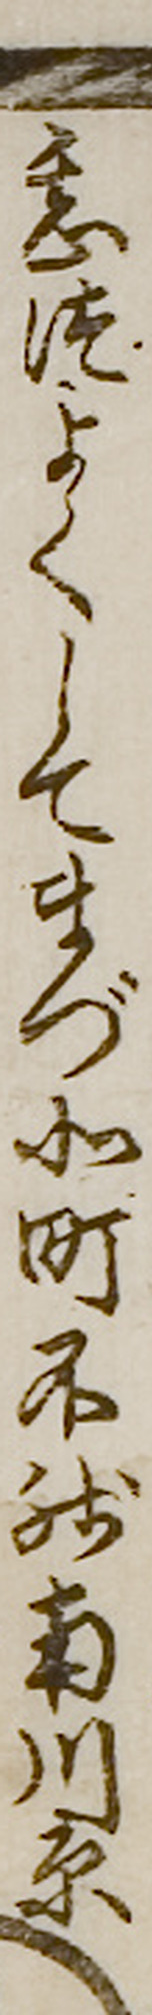甚つよくしてまづ北町不残南川原
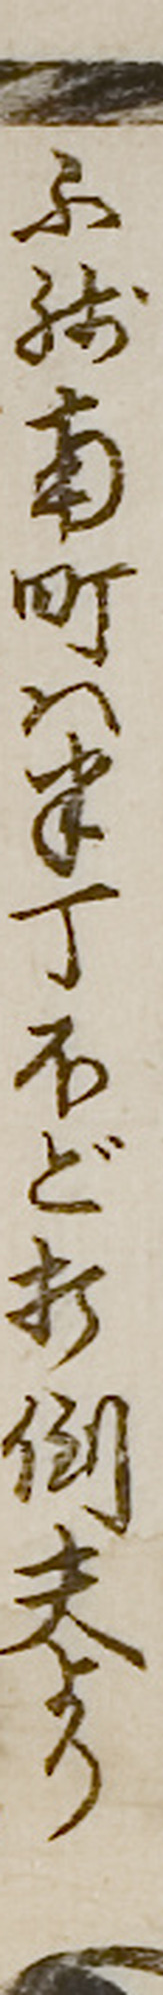不残南町は半丁ほど打倒夫より
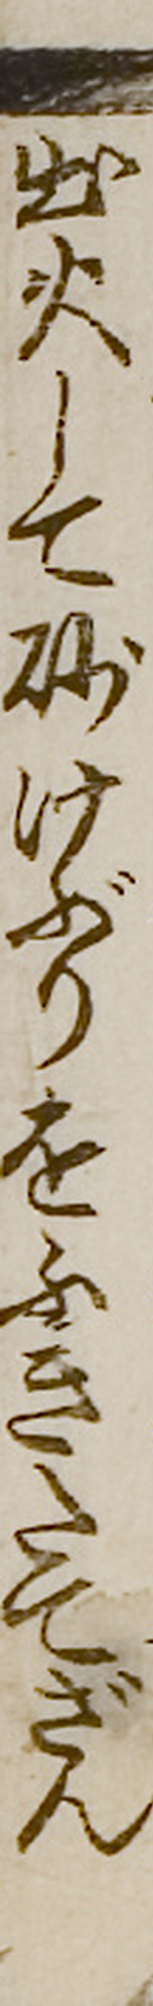出火して砂けぶりをふきたてざん
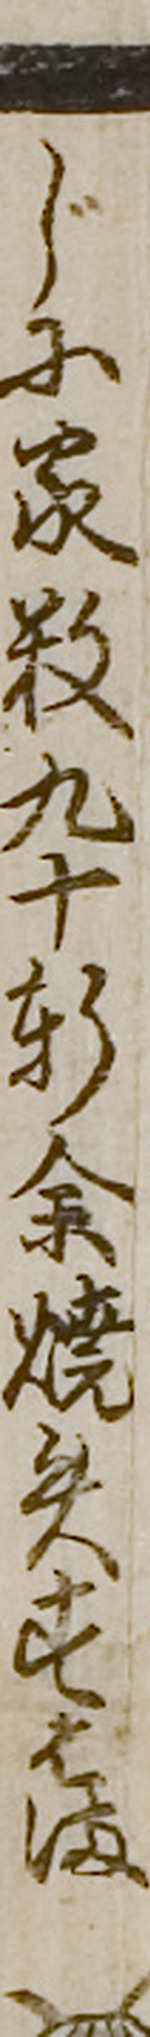じに家数九十軒余焼失すはま
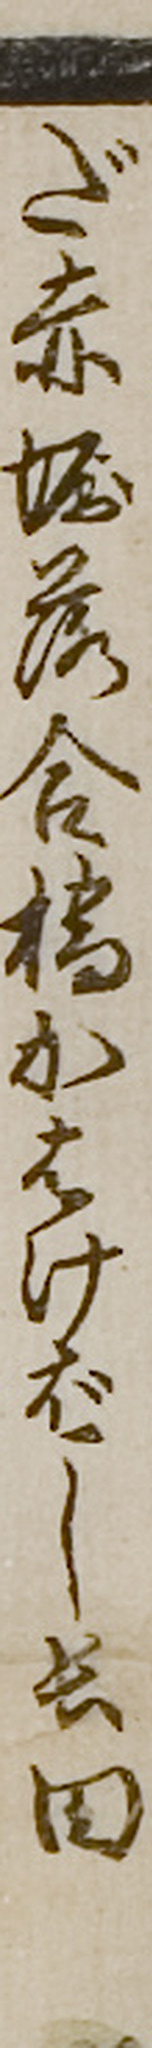だ赤堀落合橋かはけばし長田
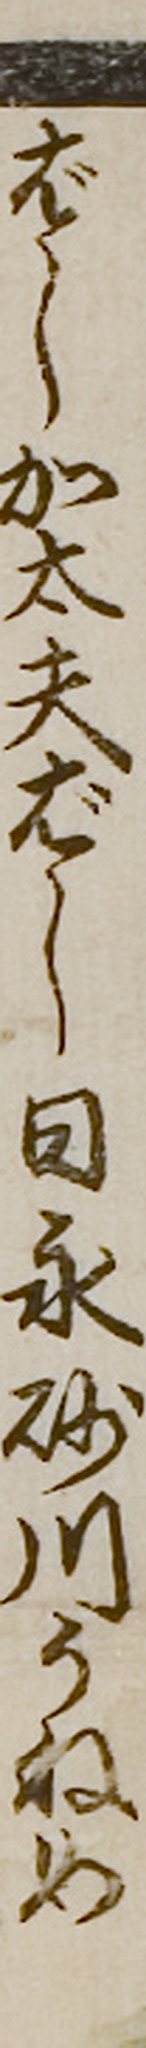ばし加太夫ばし日永砂川うねめ
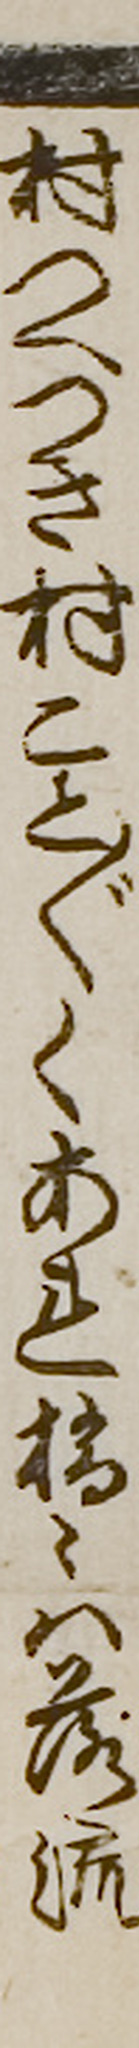村つへつき村こと〴〵くあれ橋々は落流
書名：伊勢伊賀志摩近江尾張美濃大地震の図
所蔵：東京大学総合図書館 General Library in the University of Tokyo, JAPAN
